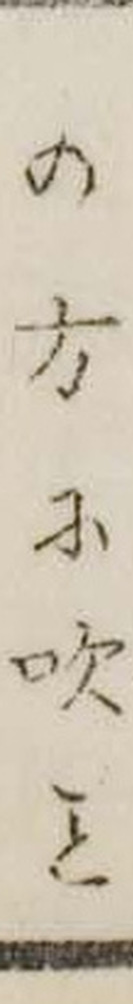の方に吹こと
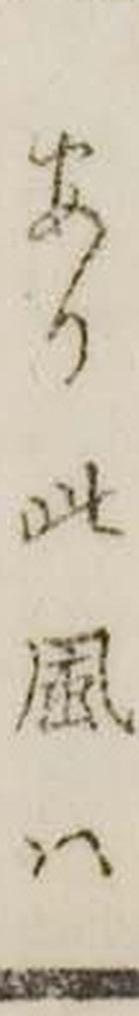あり此風は
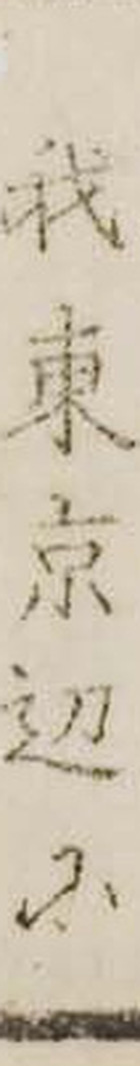我東京辺に
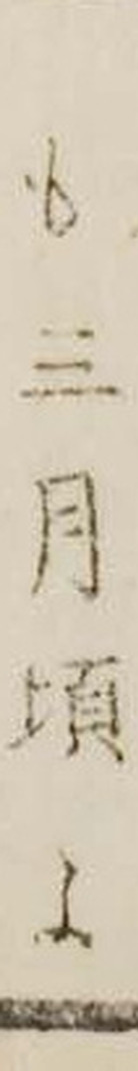も三月頃よ
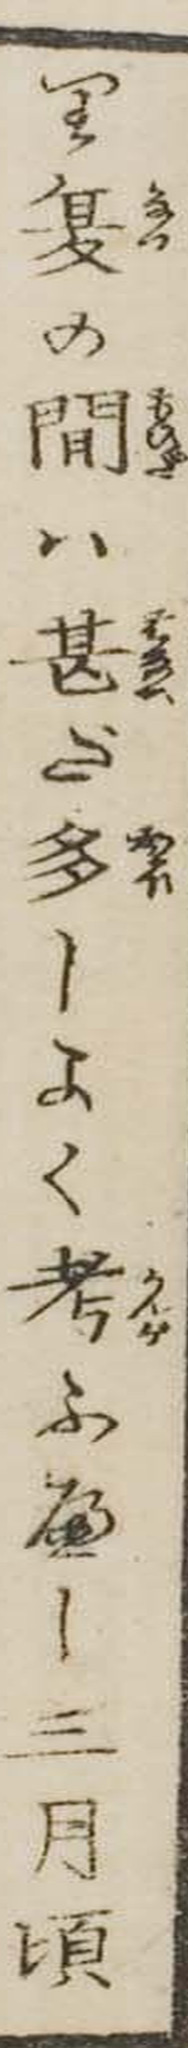り夏の間は甚だ多しよく考ふへし三月頃
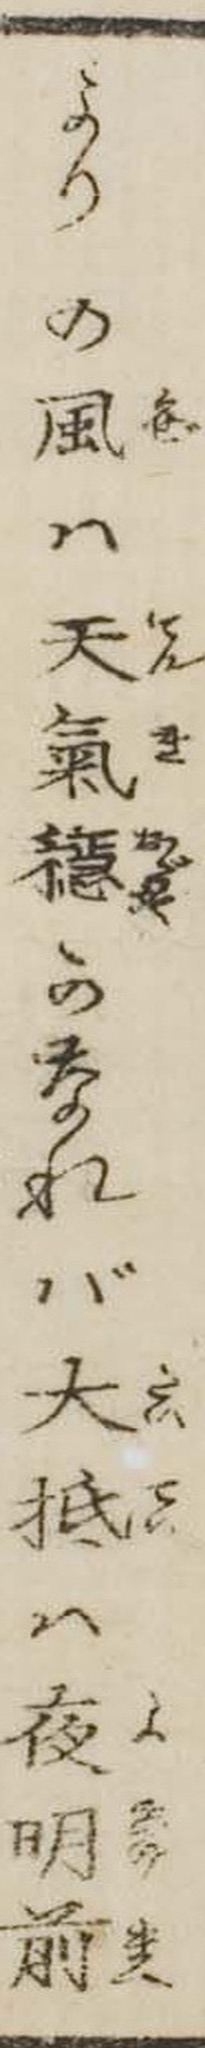よりの風は天氣穏かなれば大抵は夜明前
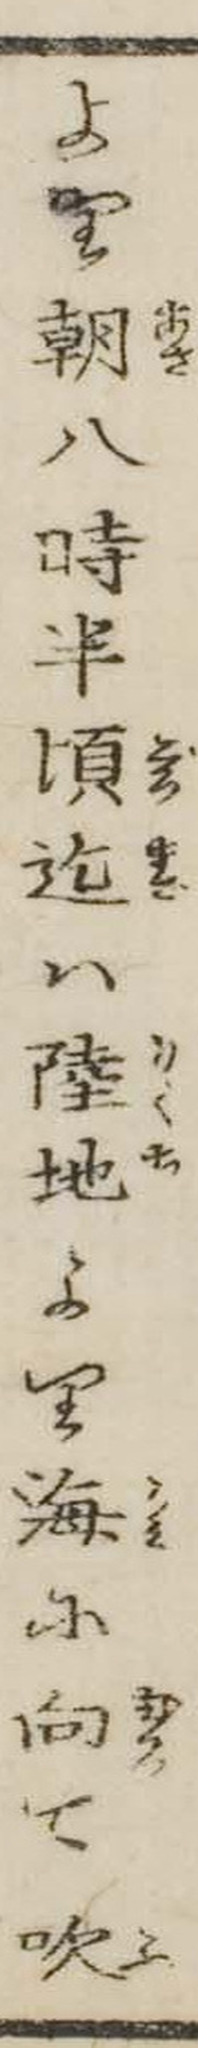より朝八時半頃迄は陸地より海に向て吹
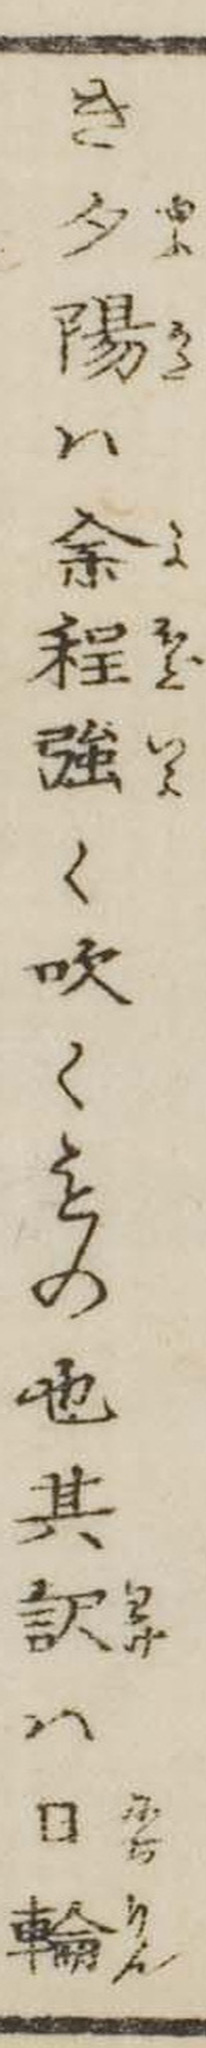き夕陽は余程強く吹くもの也其訳は日輪
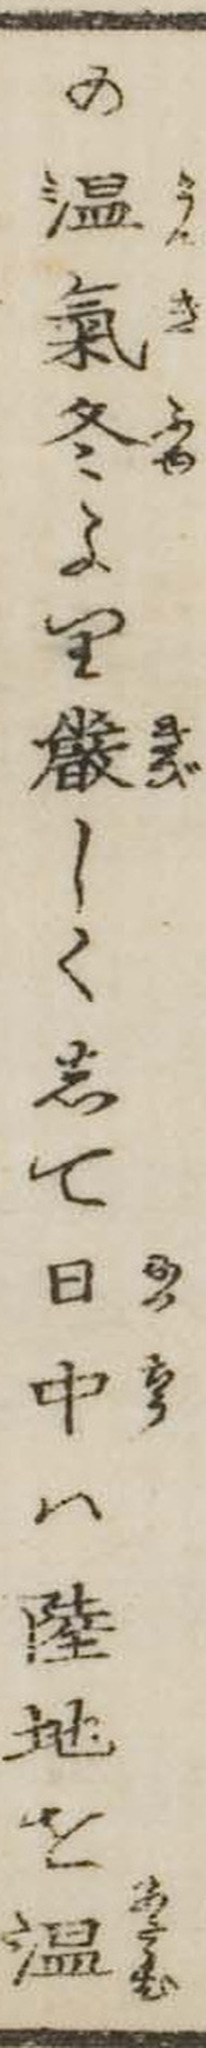の温氣冬より厳しくして日中は陸地を温
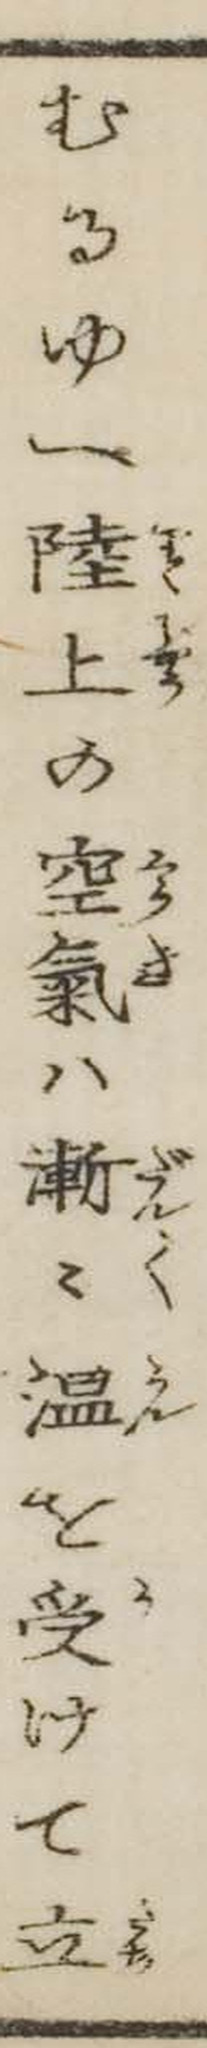むるゆへ陸上の空氣は漸〻温を受けて立
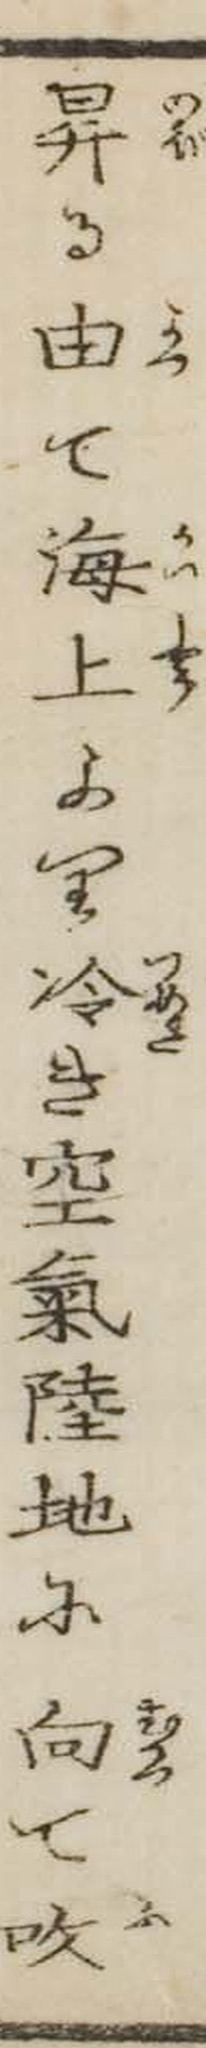昇る由て海上より冷き空氣陸地に向て吹
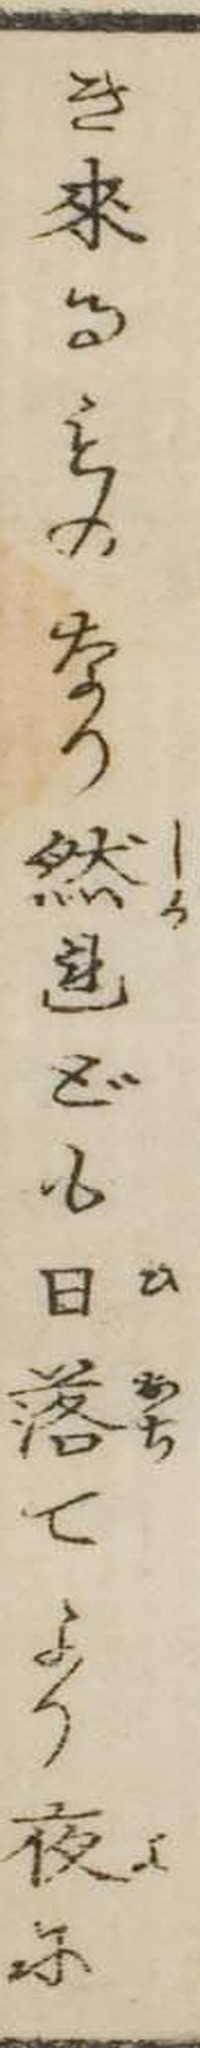き來るものなり然れども日落てより夜に

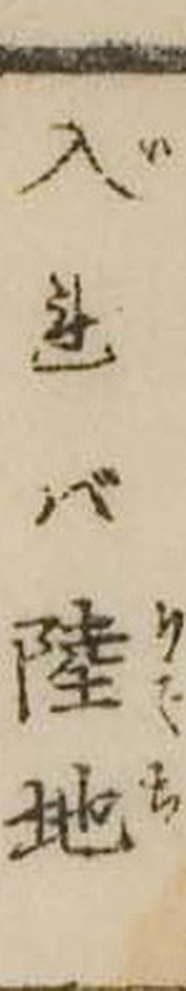入れば陸地
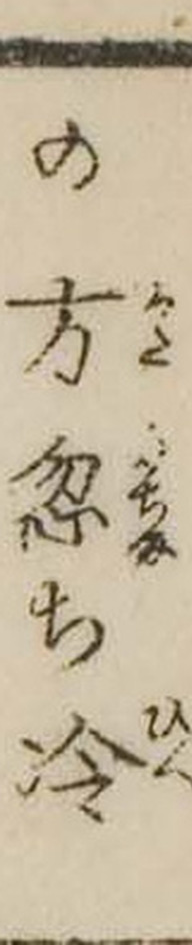の方忽ち冷
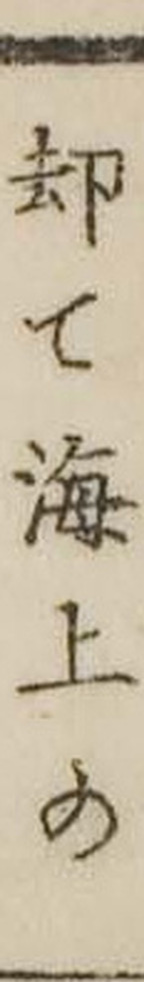却て海上の
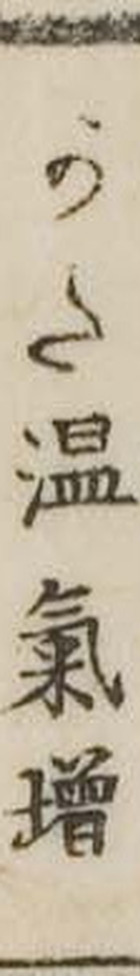かた温氣増
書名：究理知慧の勧 : 訓蒙画入 巻之2
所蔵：東京学芸大学附属図書館
